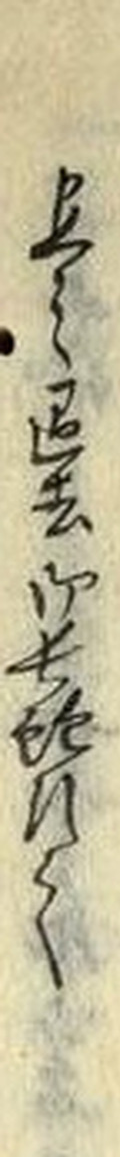申上之退去御長鮑引之
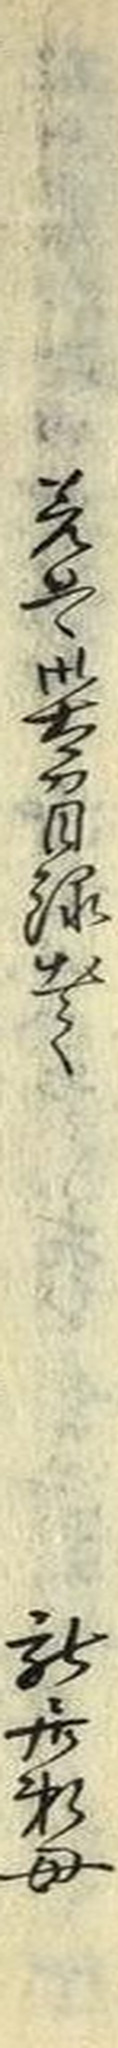差上候御太刀目録出之新居頼母
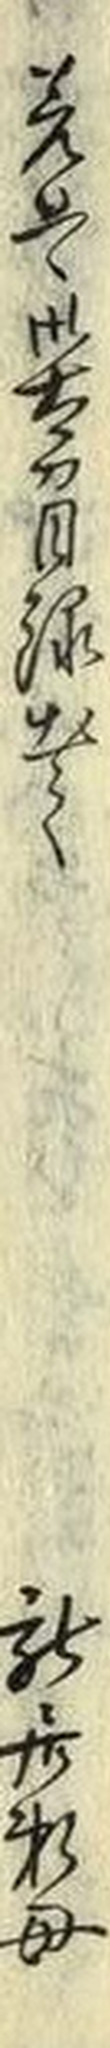差上候御太刀目録出之新居頼母
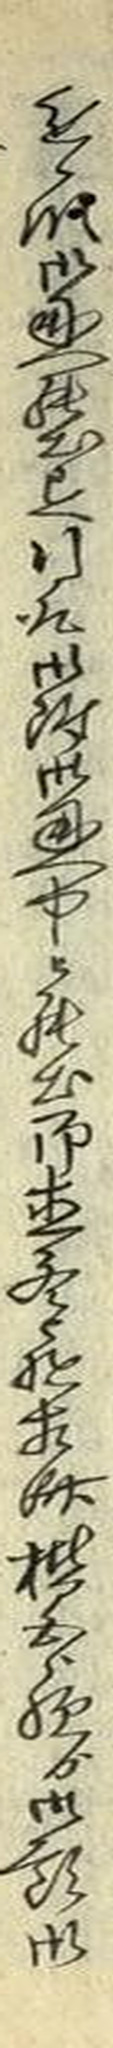進候段御用人罷出申上引取御附御用人中被罷出御直答被遊相済楷五郎様ゟ御影御
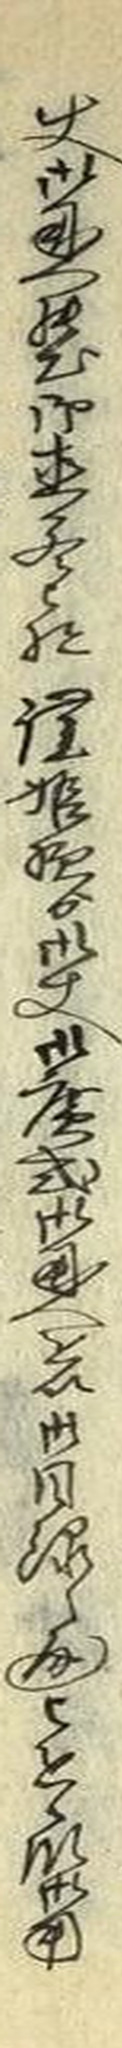使御用人罷出御直答被遊謹姫様ゟ御使御広式御用人を以御目録之通被進候段御用
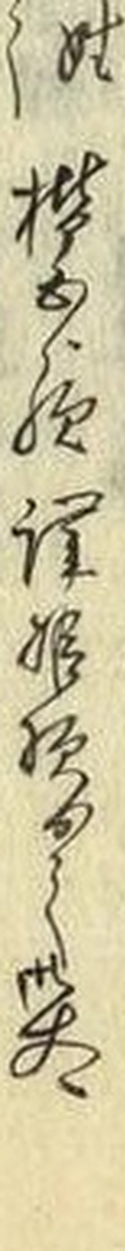役之楷五郎様謹姫様ゟ之御使へ
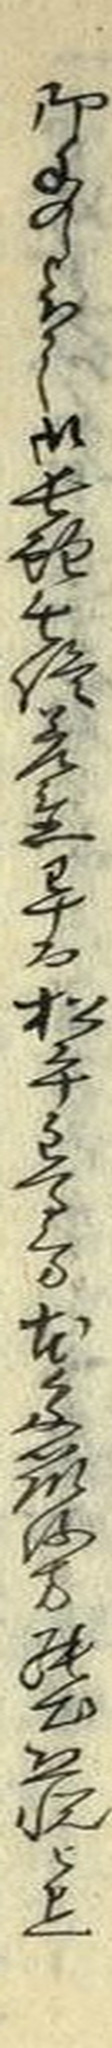御手のし被下之御長鮑其儘差置畢而松平主馬方本多筑後方罷出恐悦被申上
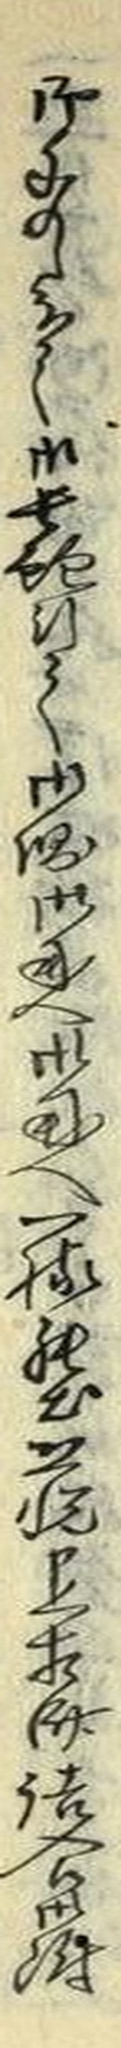御手のし被下之御長鮑引之御側御用人御用人一統罷出恐悦申上相済詰合御附
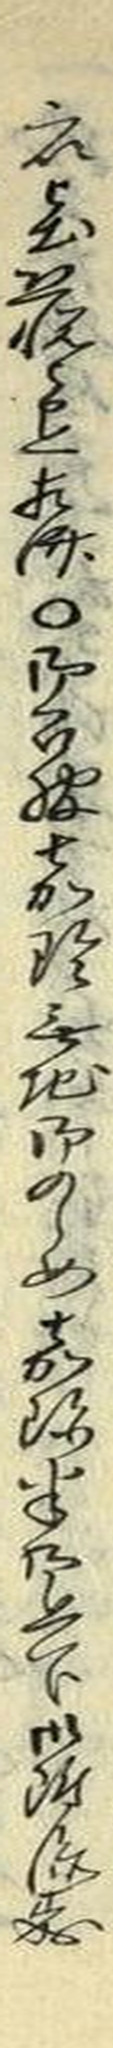衆被出恐悦被申上相済〇御召服嘉珍無地御のしめ嘉珎半御上下御附添森
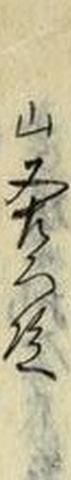山又左衛門殿
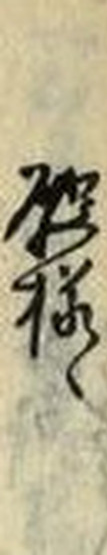殿様へ
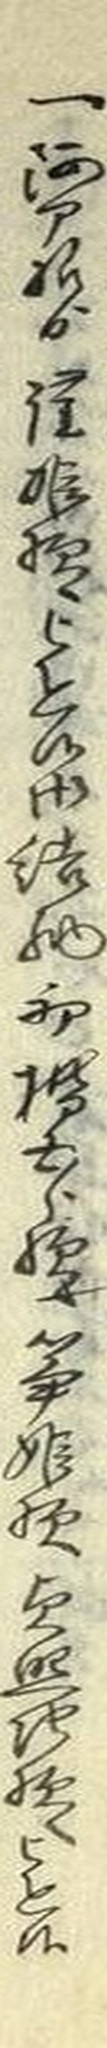一阿部様ゟ謹姫様へ被進候御結納初楷五郎様箏姫様貞照院様へ被進候
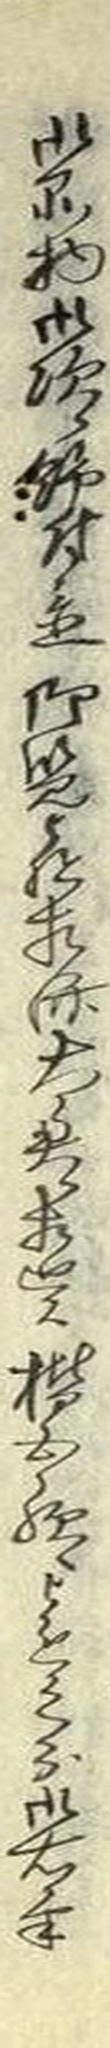御品物御次へ飾付置御覧被遊相済大奥へ相廻ス楷五郎様へ被進之分御右筆
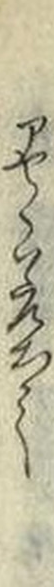部屋へ差出之
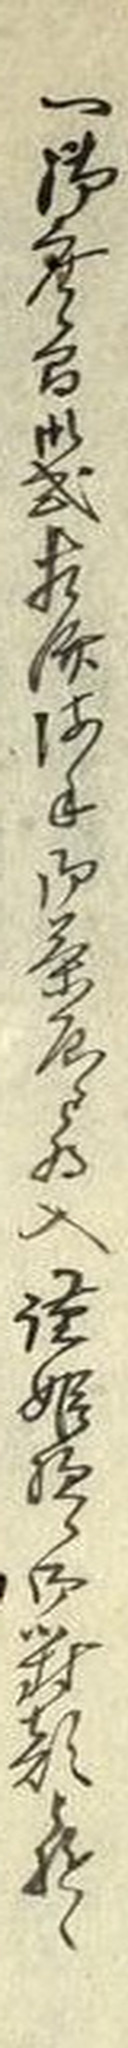一御座之間御式相済海手御茶屋へ被為入謹姫様へ御対顔被遊候
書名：少傅日録抄（斉善付側向頭取日記、在府）
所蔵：福井県文書館 Fukui Prefectural Archives
